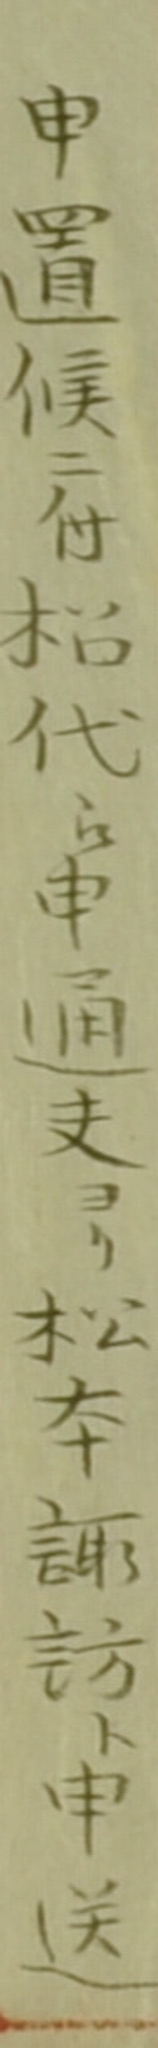申置候ニ付松代江申通夫ヨリ松本諏訪ト申送
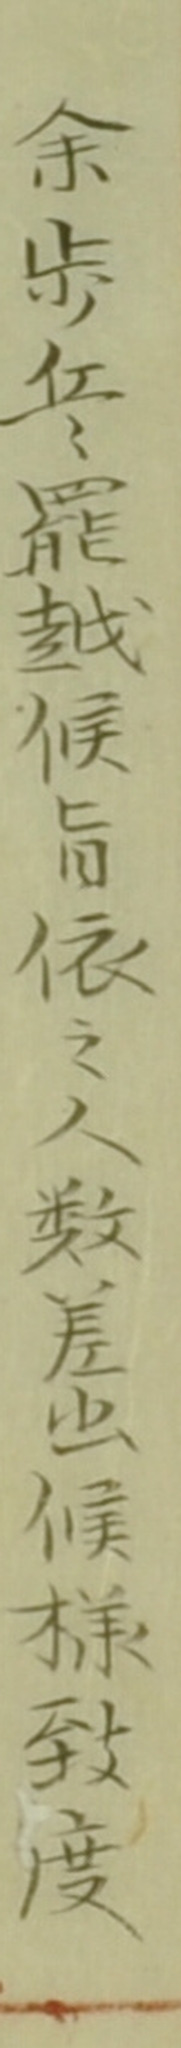余歩兵罷越候旨依之人数差出候様致度
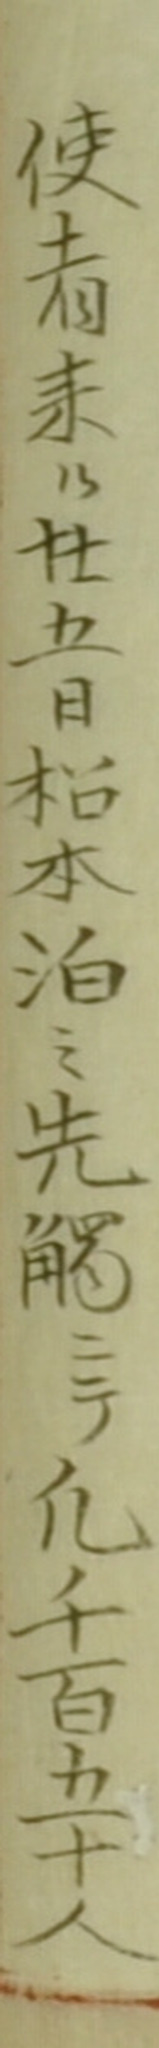使者来ル廿五日松本泊之先触ニテ凡千百五十人
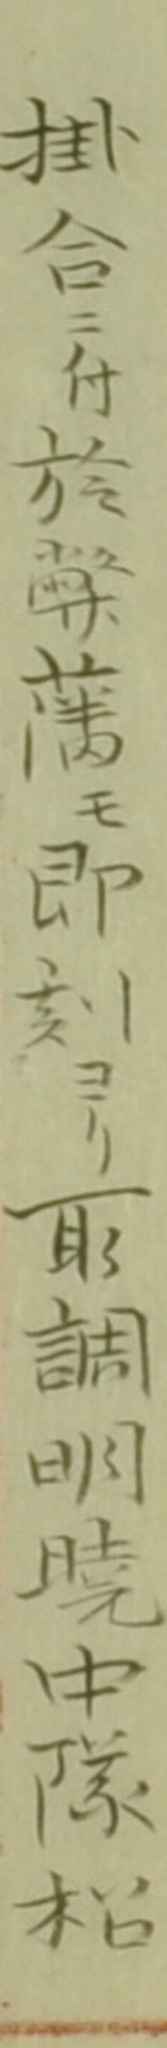掛合ニ付於弊藩モ即刻ヨリ取調明暁中隊松
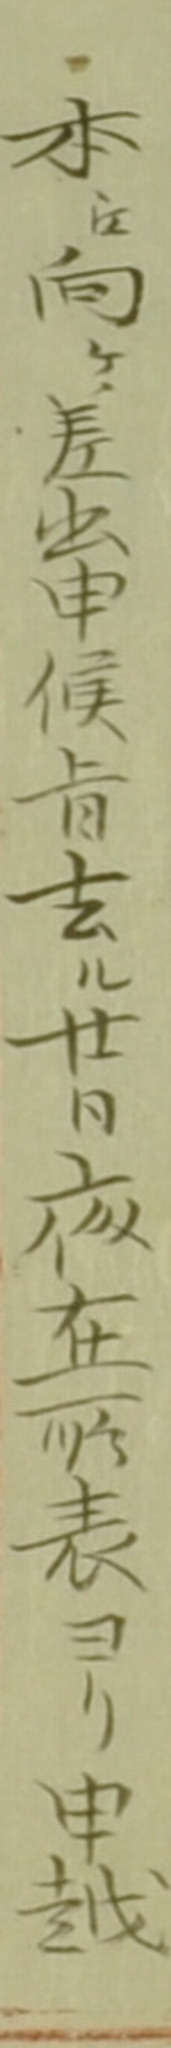本江向ケ差出申候旨去る廿日夜在所表ヨリ申越
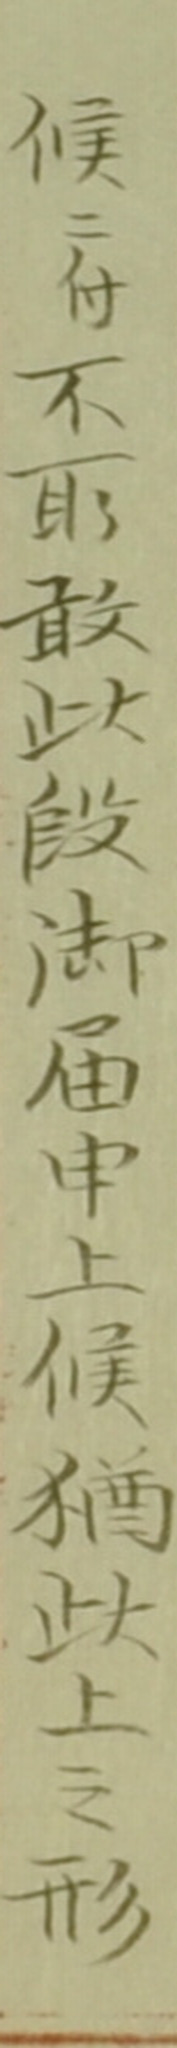候ニ付不取敢此段御届申上候猶此上之形
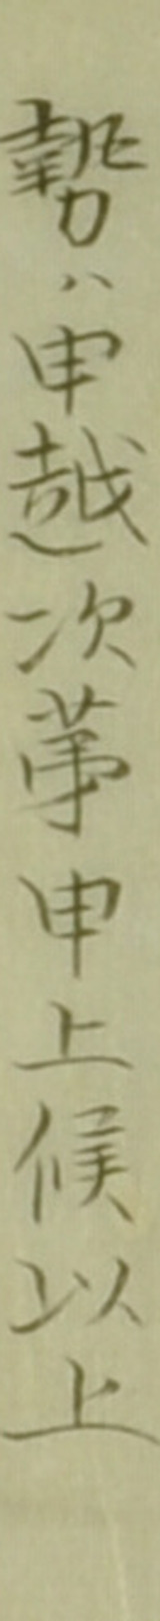勢ハ申越次第申上候以上
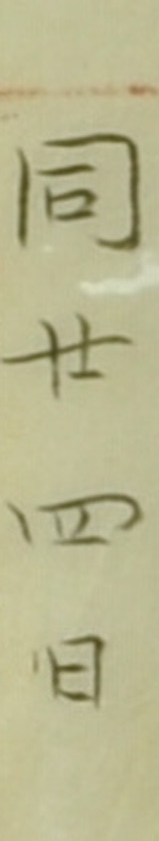同廿四日
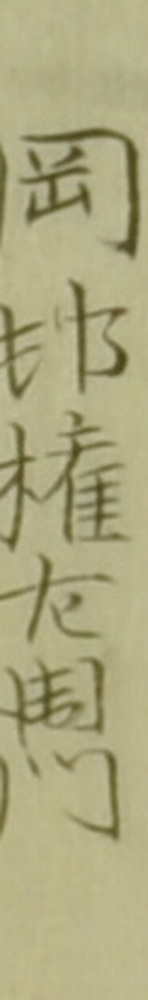岡邨権左衛門

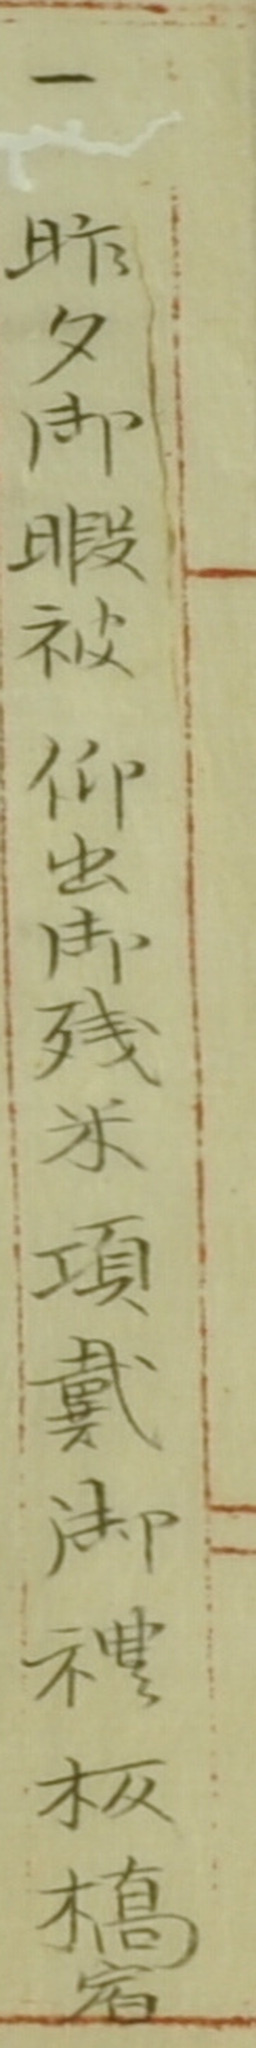一昨夕御暇被仰出御残米頂戴御礼板橋
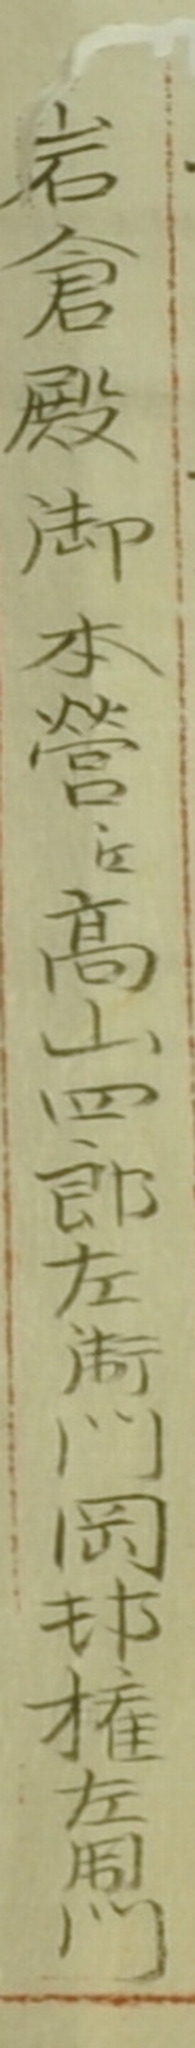岩倉殿御本営江高山四郎左衛門岡邨権左衛門
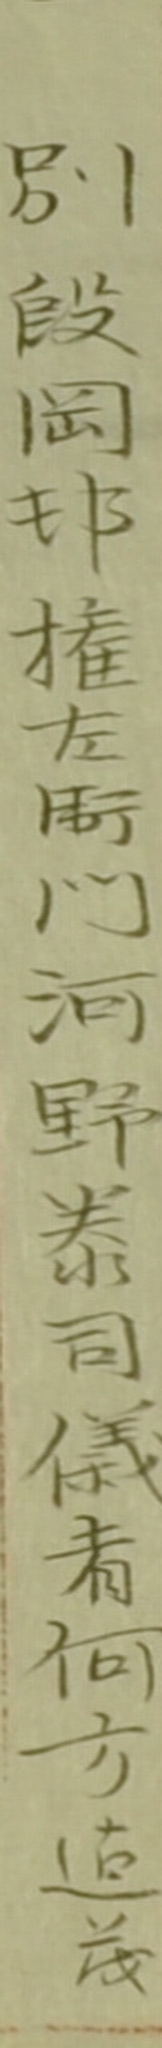一別段岡邨権左衛門河野泰司儀者何方迄茂
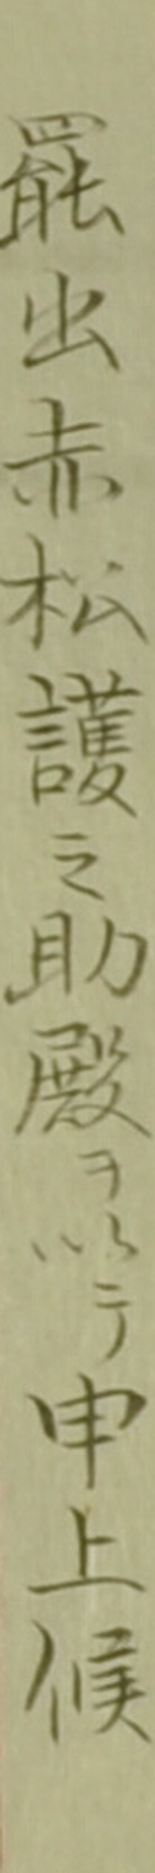罷出赤松護之助殿ヲ以テ申上候
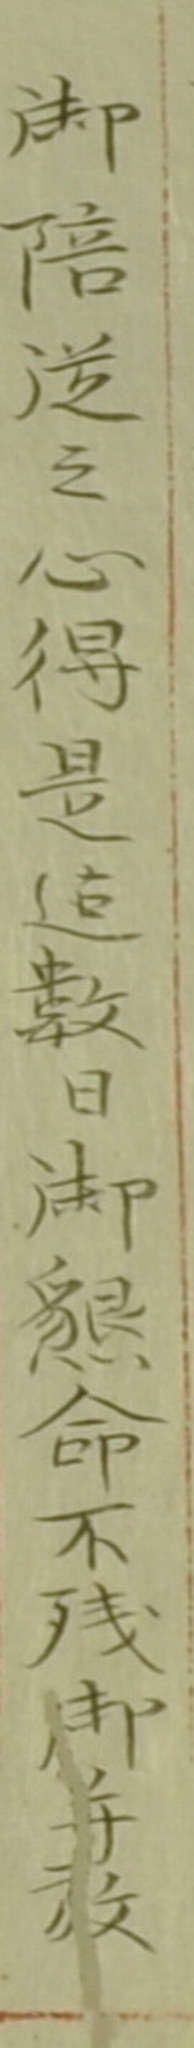御陪従之心得是迄数日御懇命不残御手放
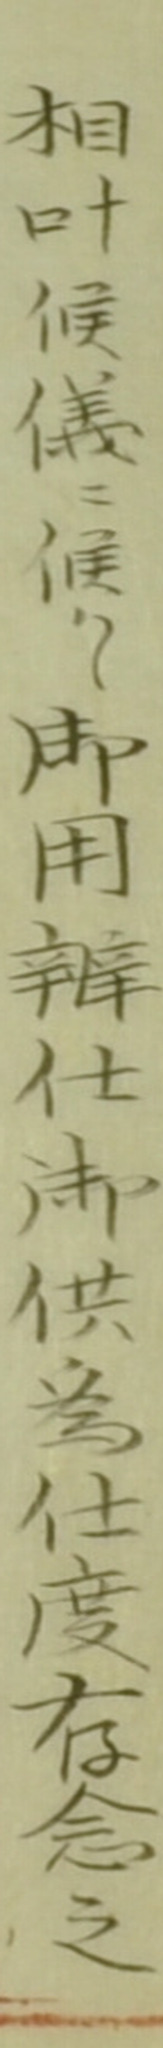相叶候儀ニ候ハバ御用弁仕御供為仕度存念之
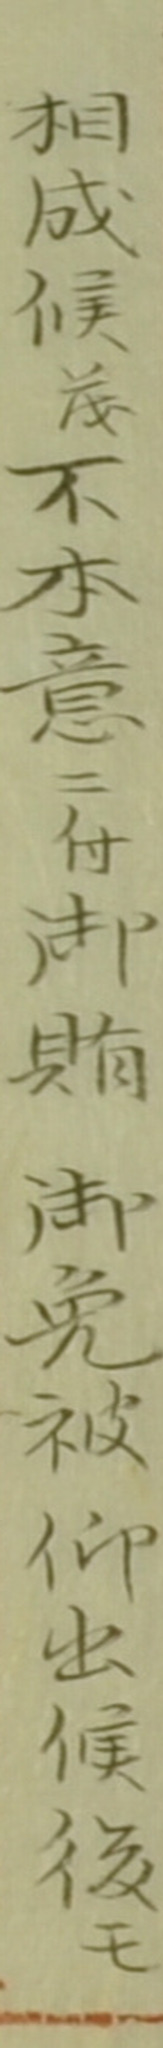相成候茂不本意ニ付御賄御免被仰出候後モ
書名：御東征ニ付甲州口兵食人馬御賄之事件（控）
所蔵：伊那市立高遠町図書館・合同会社AMANE
